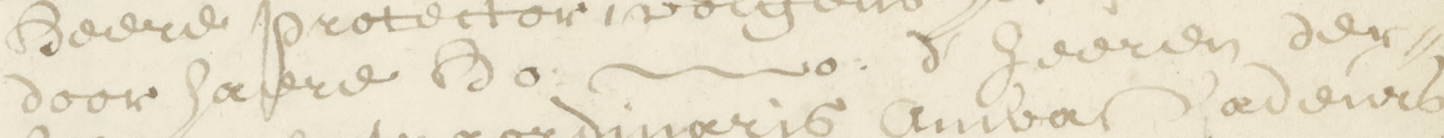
door haere Ho:Mo: d'heeren der„
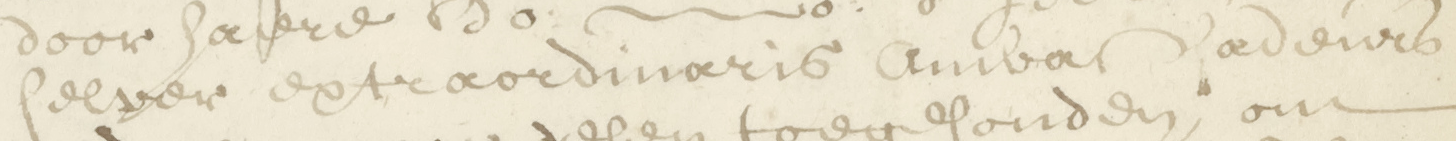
selver extraordinaris Ambassadeurs
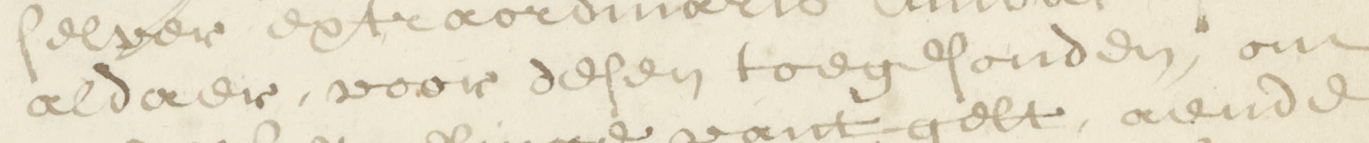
aldaer, voor desen toegesonden, om
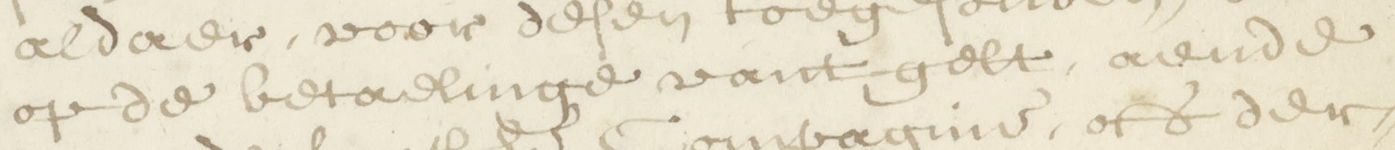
op de betaelinge vant gelt, aende
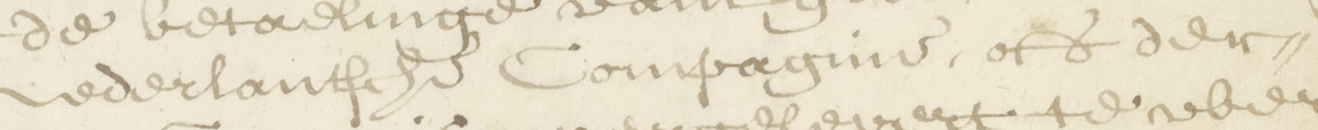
Nederlantsche Compagnie off der„
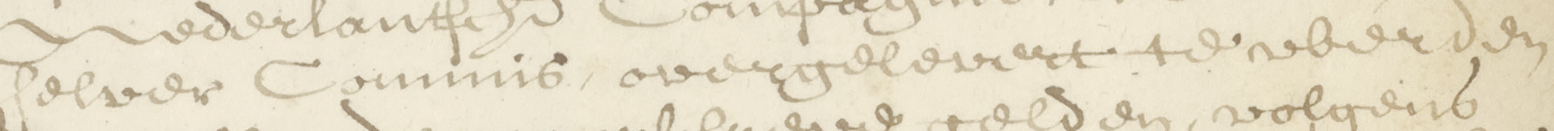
selver Commis overgelevert te werden.
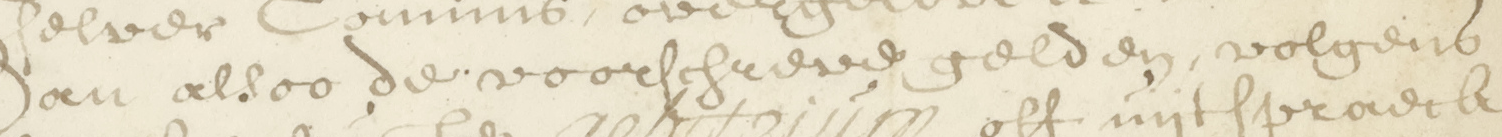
Dan alsoo de voorschreve gelden, volgens
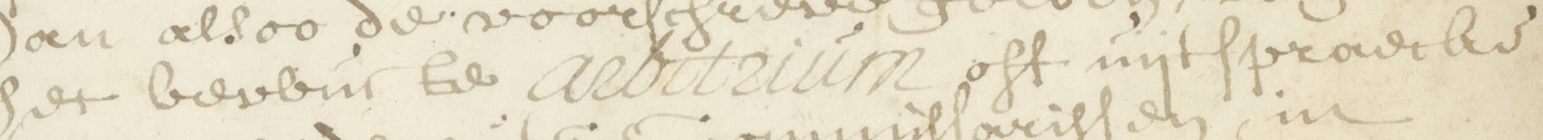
het bewuste arbitrium off uijtspraecke
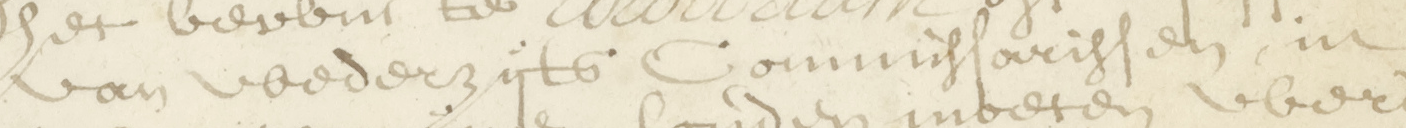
van wederzijts commissarissen, in
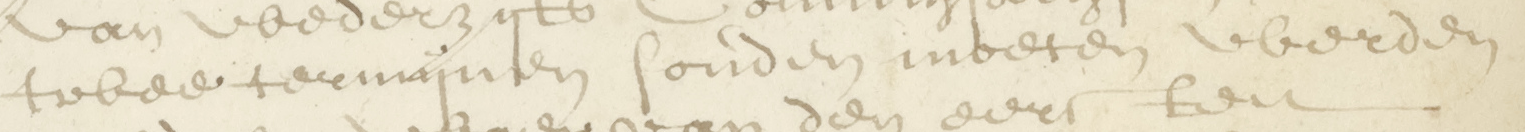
twee termijnen souden moeten werden
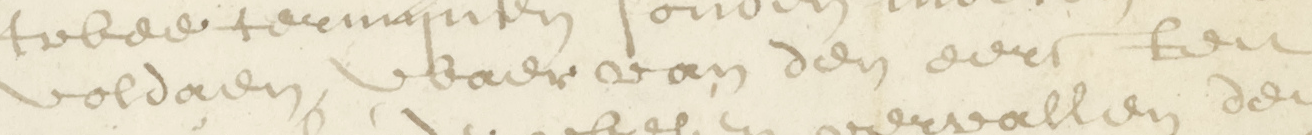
voldaen, waervan den eersten
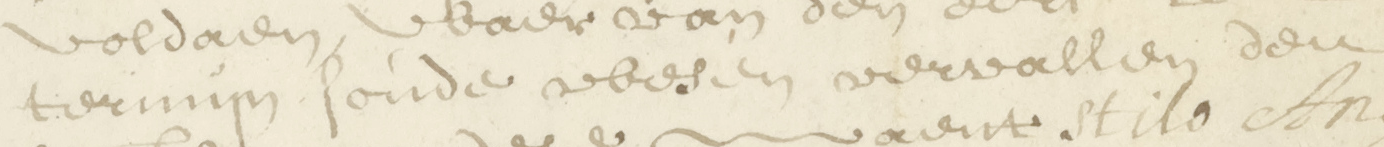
termijn soude wesen vervallen den
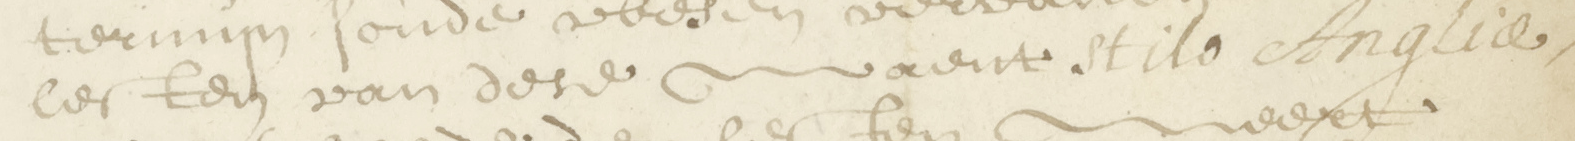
lesten van dese maent stilo Anglie,
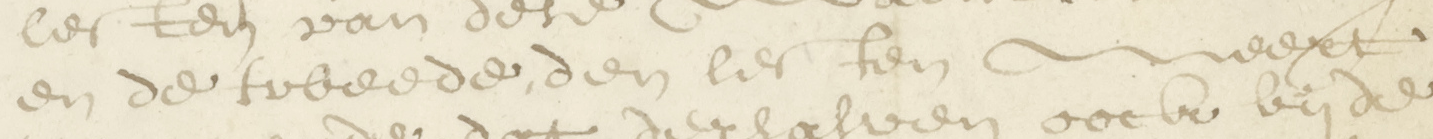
en de tweede, den lesten Meert
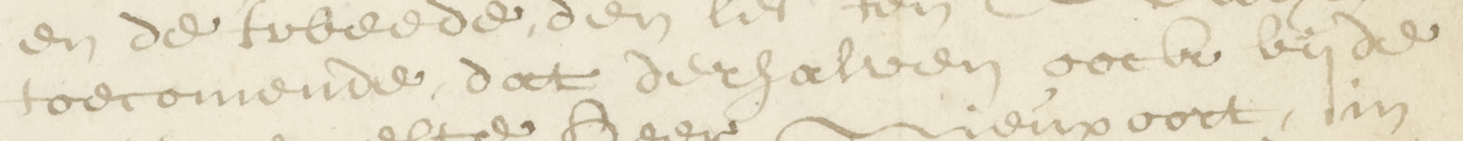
toecomende. dat derhalven oock bij de
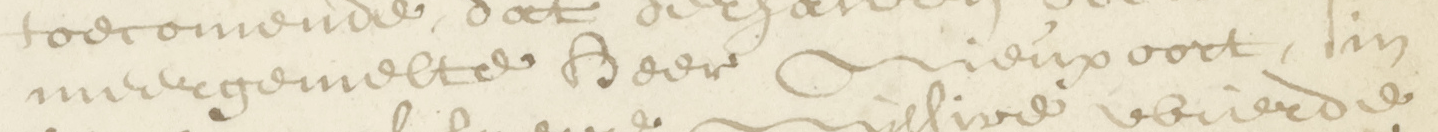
meergemelte Heer Nieupoort, in
